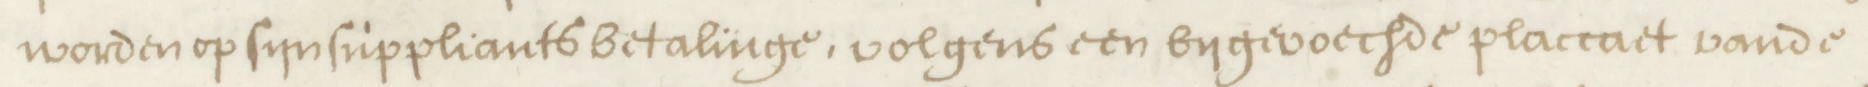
worden op syn suppliants betalinge, volgens een bygevoechde placcaet vande
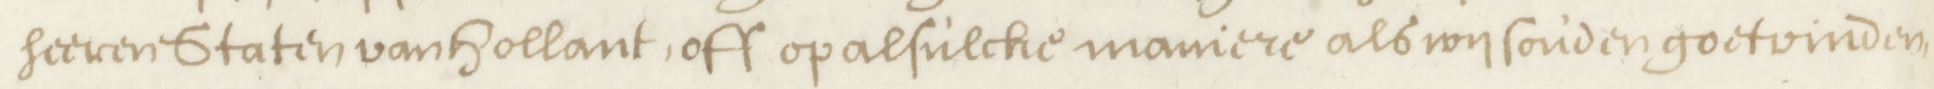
heeren Staten van Hollant, off op alsulcke maniere als wy souden goetvinden.
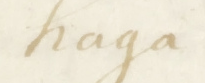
haga
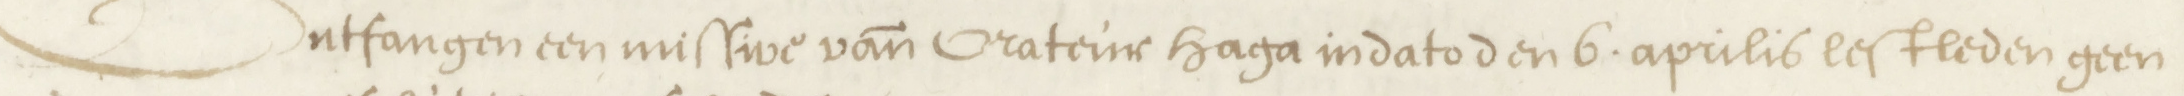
Ontfangen een missive van Orateur Haga in dato den 6. aprilis lestleden geen
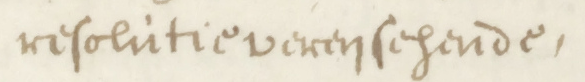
resolutie vereyschende,
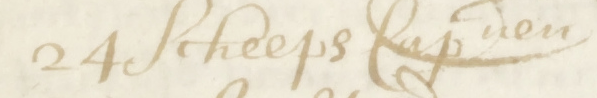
24 Scheeps Capnen
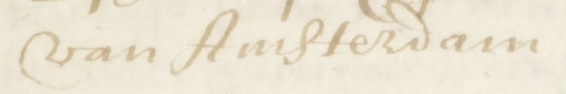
van Amsterdam
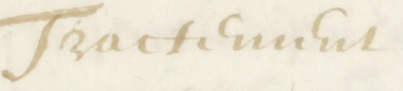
Tractement
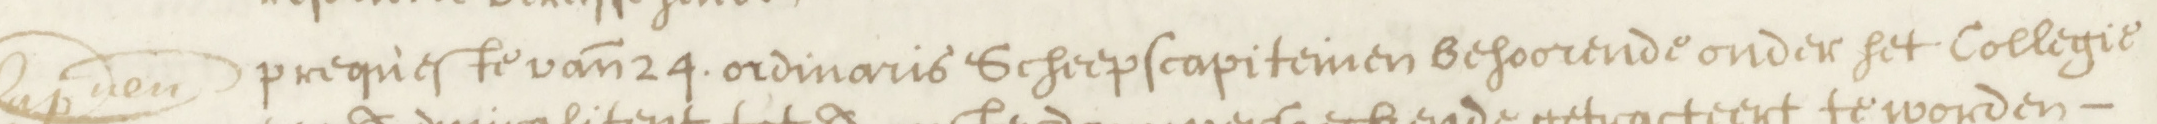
Op requeste van 24. ordinaris Scheepscapiteinen behoorende onder het Collegie
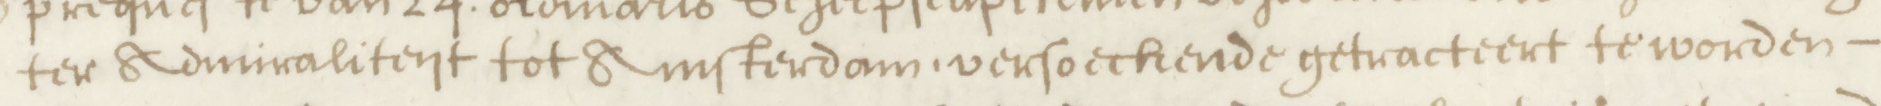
ter Admiraliteyt tot Amsterdam, versoeckende getracteert te worden —
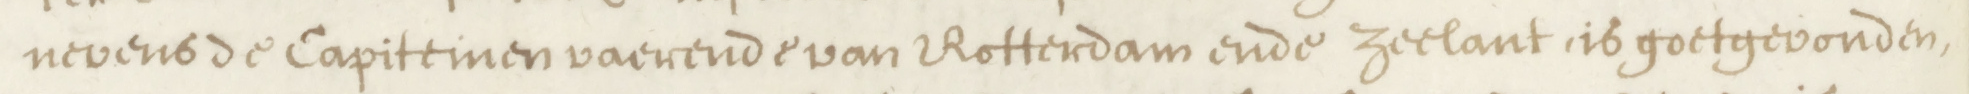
nevens de Capiteinen vaerende van Rotterdam ende Zeelant, is goetgevonden,
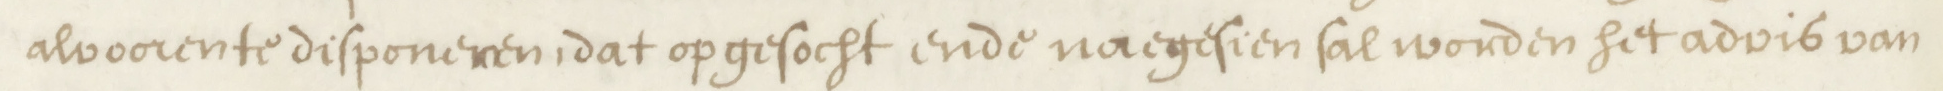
alvooren te disponeren, dat opgesocht ende naegesien sal worden het advis van
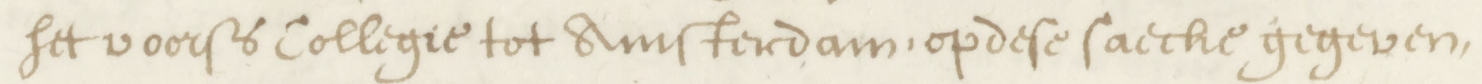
het voors Collegie tot Amsterdam, op dese saecke gegeven.
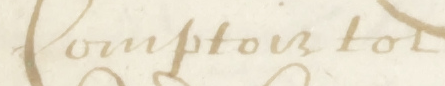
Comptoir tot
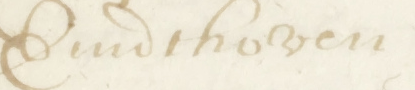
Eindthoven
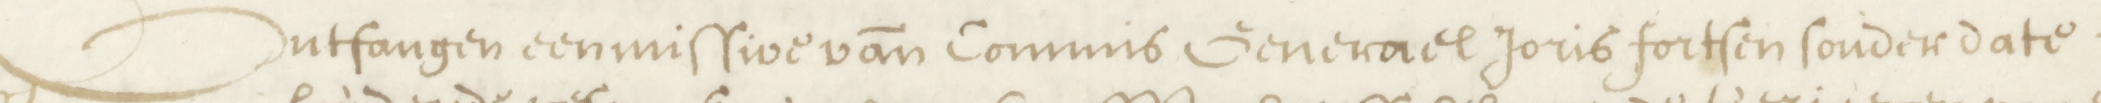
Ontfangen een missive van Commis Generael Joris fortsen sonder date —
